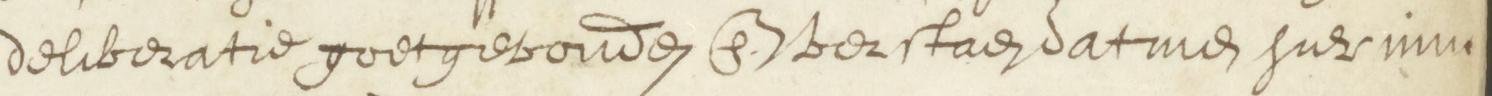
deliberatie goetgevonden & verstaen dat men hierinne
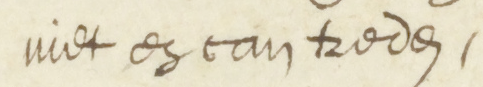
niet en can treden.
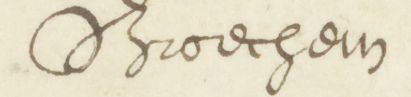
Broechem
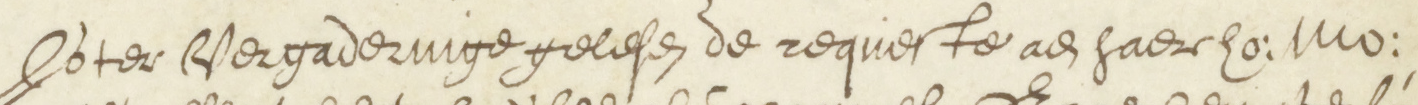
Is ter Vergaderinge gelesen de requeste aen haer ho:Mo:
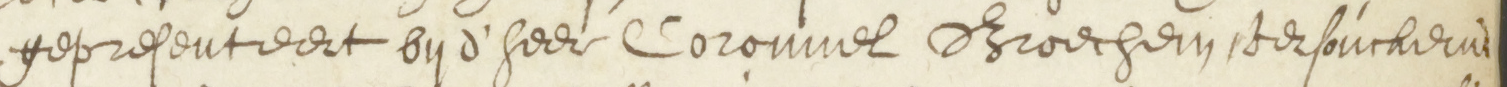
gepresenteert by d'heer Coronnel Broechem, versouckend
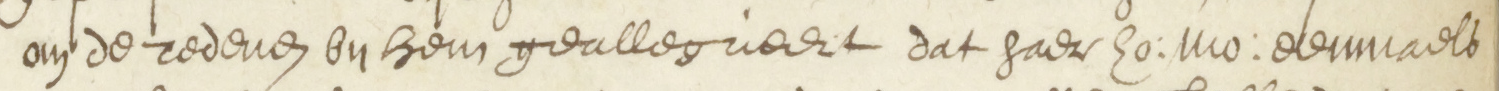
om de redenen by hem geallegueert dat haer ho:mo: eenmaels
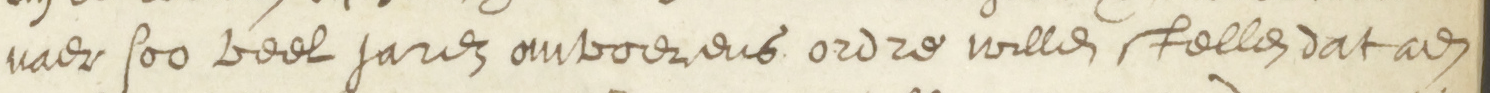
naer soo veel jaren omvoerens ordre willen stellen dat aen
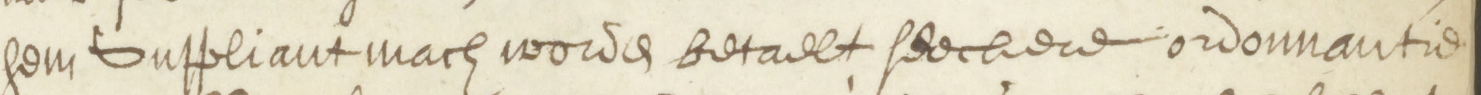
hem Suppliant mach worden betaelt seeckere ordonnantie
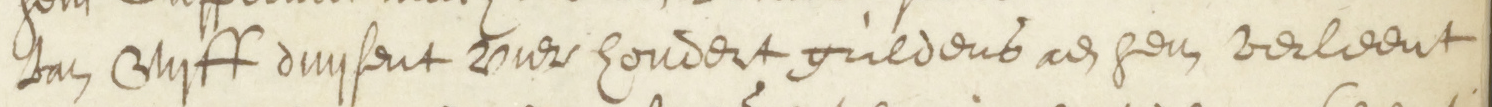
van vyff duysent vier hondert guldens aen hem verleent
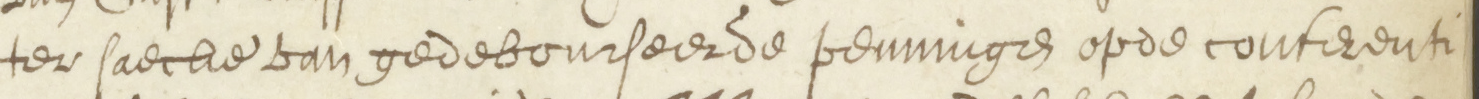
ter saecke van gedebourseerde penningen opde conferenti
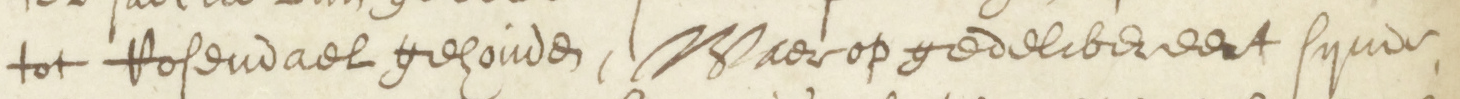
tot Rosendael gehouden. Waerop gedelibereert synde,
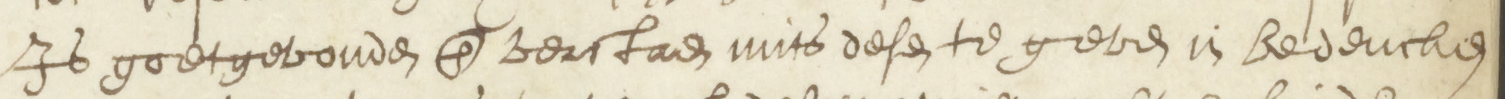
Is goetgevonden & verstaen mits desen te geven in bedencken
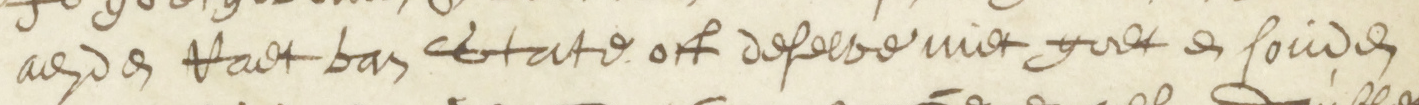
aenden Raet van State off deselve niet goet en souden
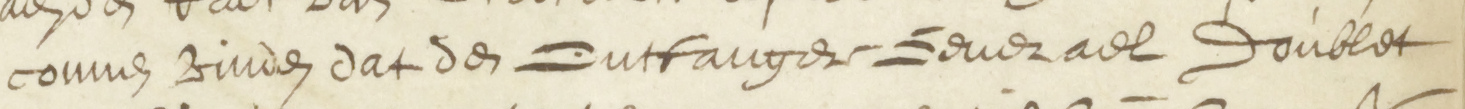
connen vinden dat den Ontfanger Generael Doublet
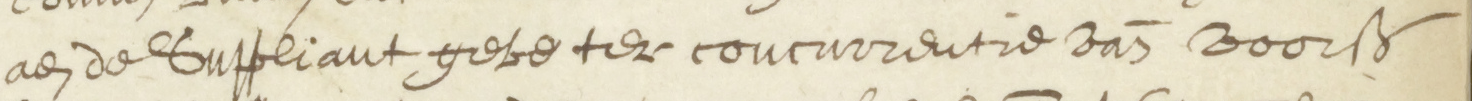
aen de Suppliant geve ter concurrentie van voors
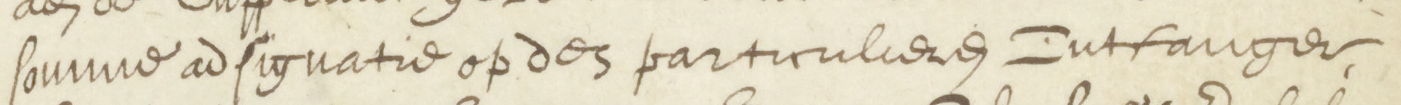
somme adsignatie op den particulieren Ontfanger
